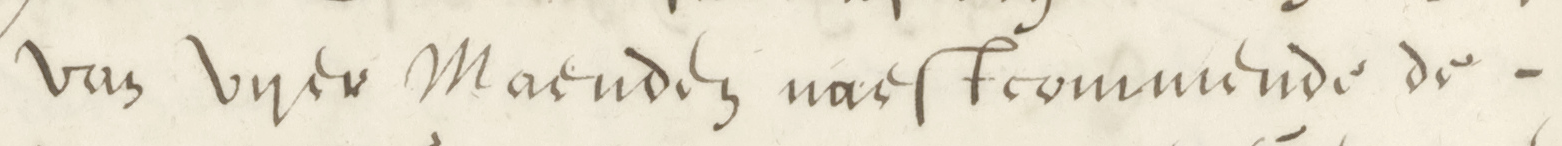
van vyer Maenden naestcommende de -
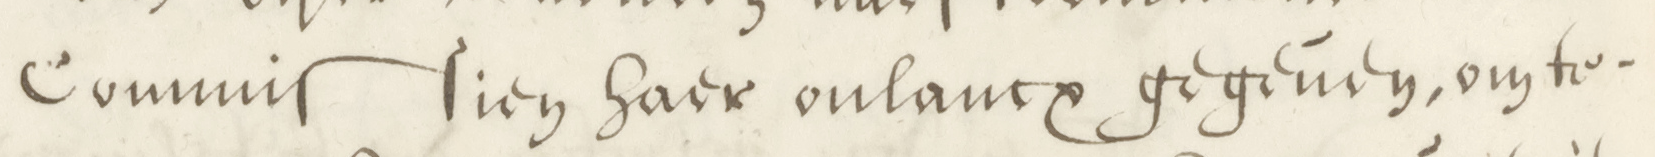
Commissien haer onlancx gegeuen, om te -
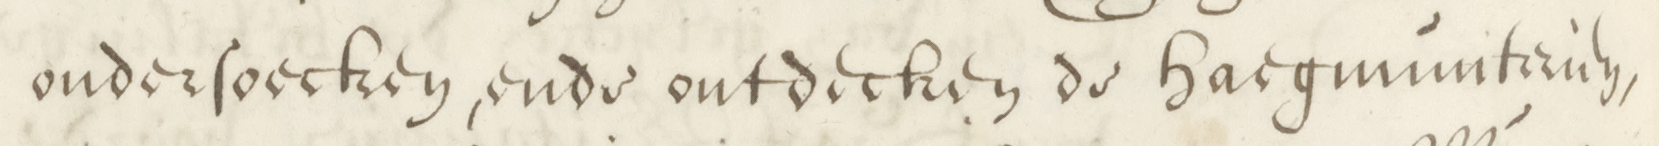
ondersoecken, ende ontdecken de haegmunterien,
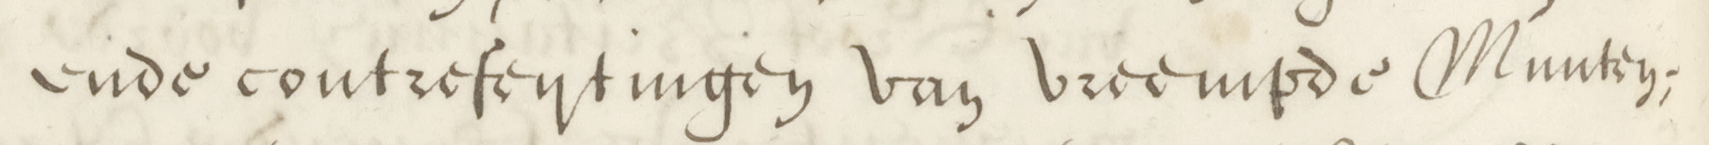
ende contrefeytingen van vreempde Munten, -
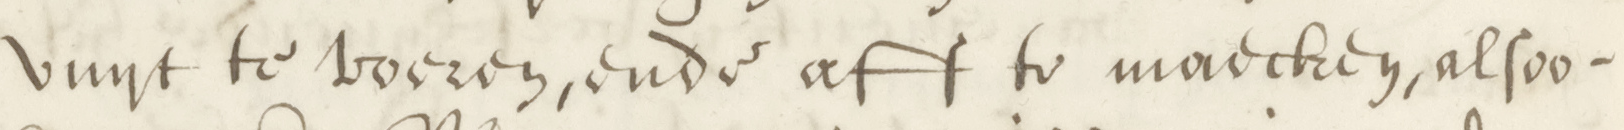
vuyt te voeren, ende aff te maecken, alsoo -
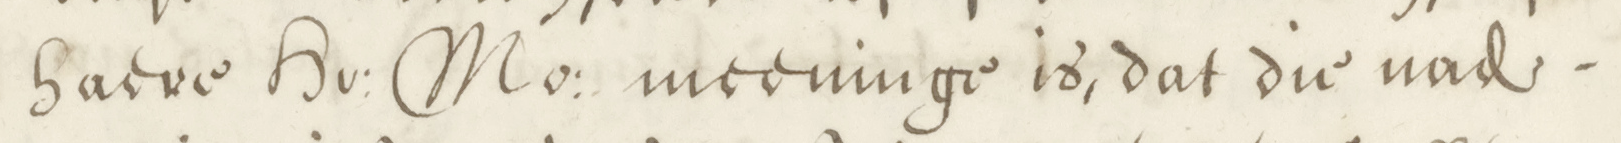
haere Ho:Mo: meeninge is, dat die nade -
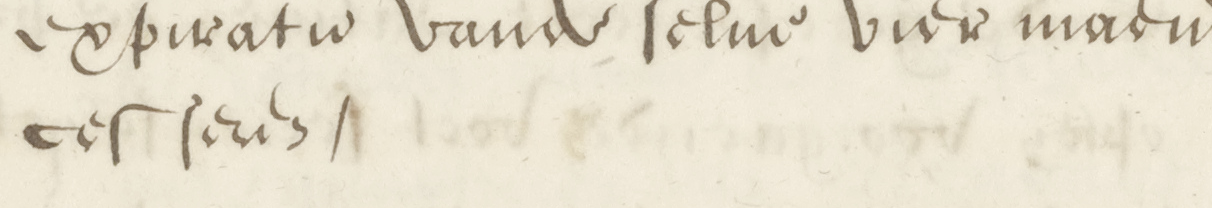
expiratie vande selue vier maenden sullen -
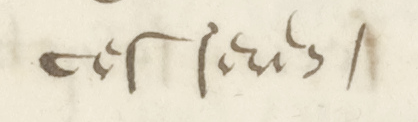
cesseren.
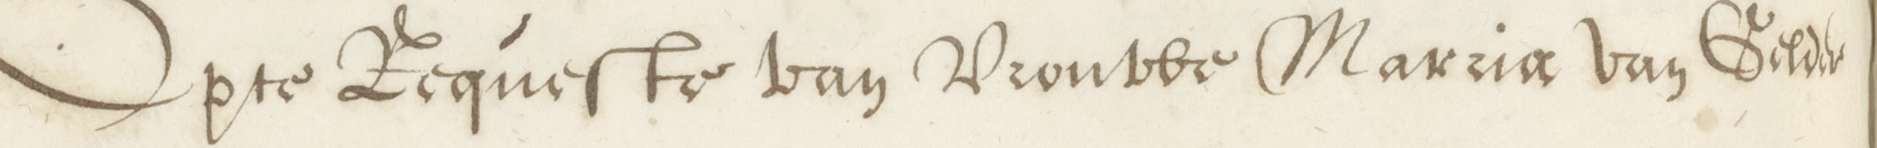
Opte Requeste van Vrouwe Marria van Gelder
